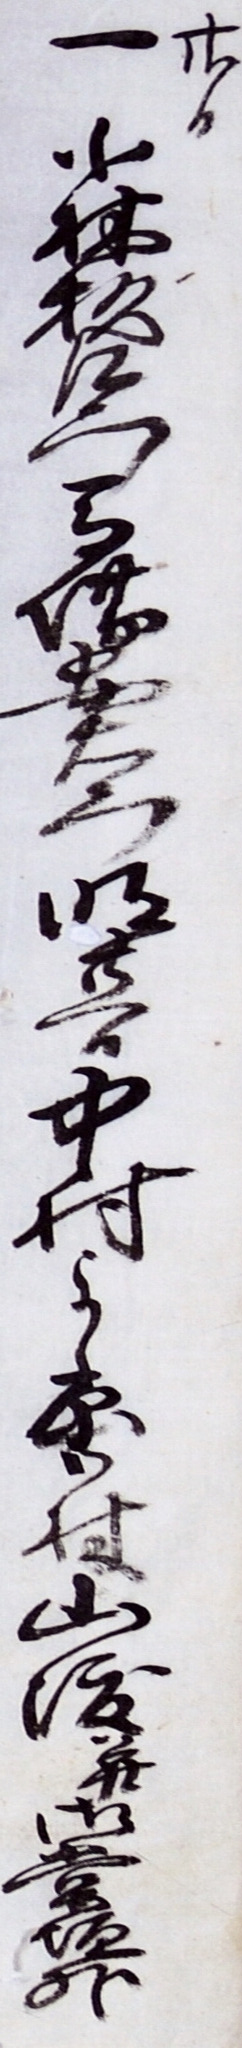一小林杉左衛門馬場安右衛門明廿一日中村よし原御林山渡并御堂垣外
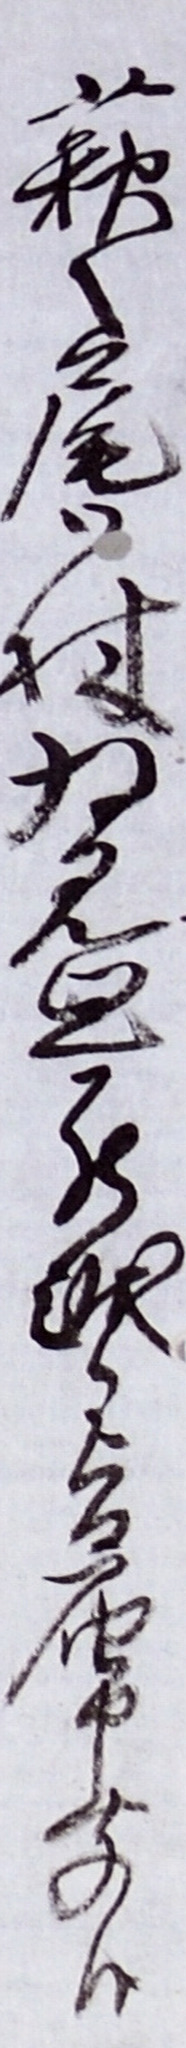荻之尾御林為見廻罷越候旨届申聞候
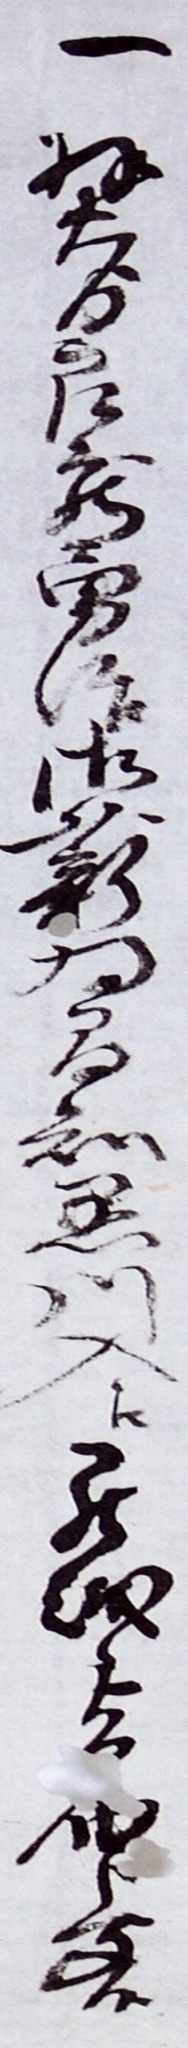一羽左衛門良蔵勇治御薪為間知黒門川入江罷越候旨届被聞候
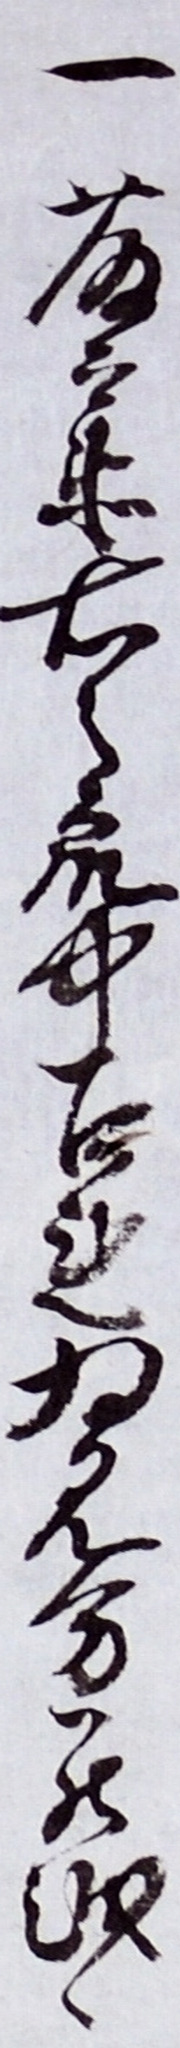一藤兵衛右之衆中召連為見分罷越候
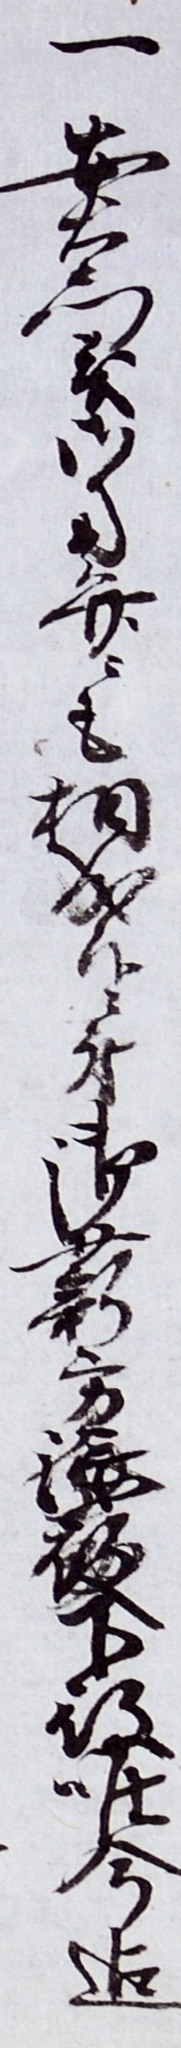一安右衛門義御用弁ニも相成候ニ付御薪方添役下役唯今迄
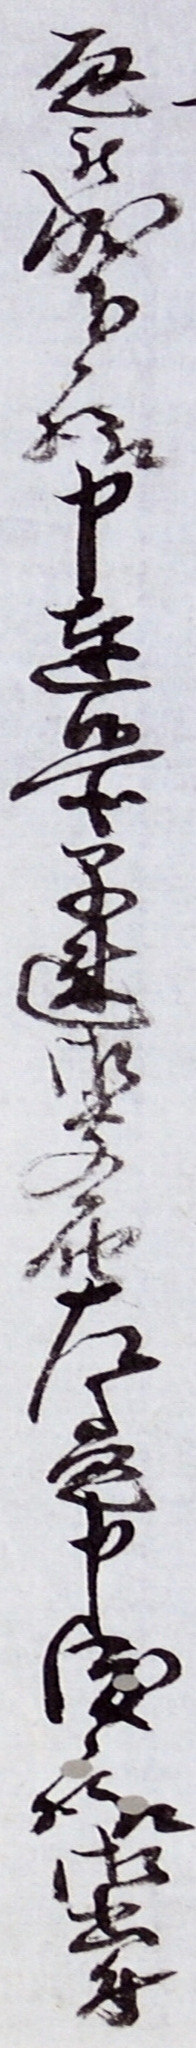通被成下候様申達候所早速御聞届左之通申渡候処御書付
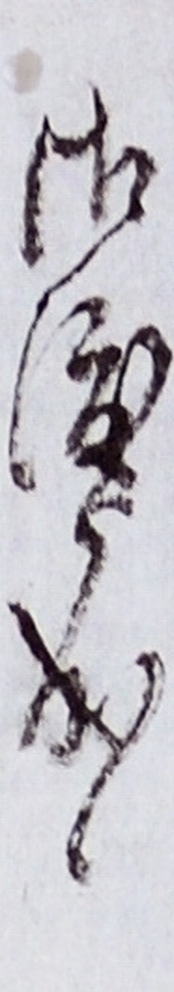御渡被成候
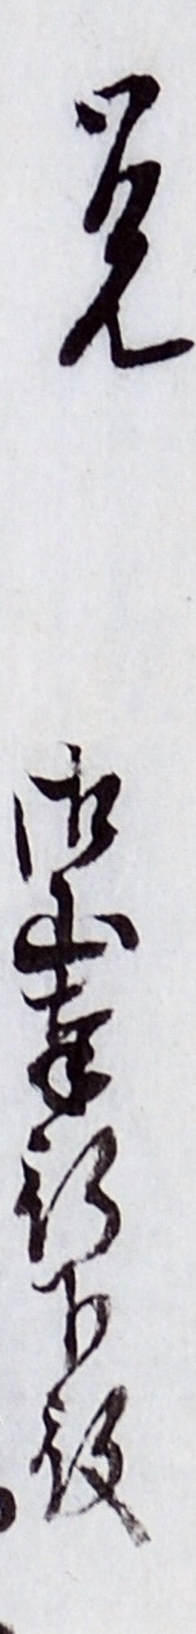覚御山奉行下役
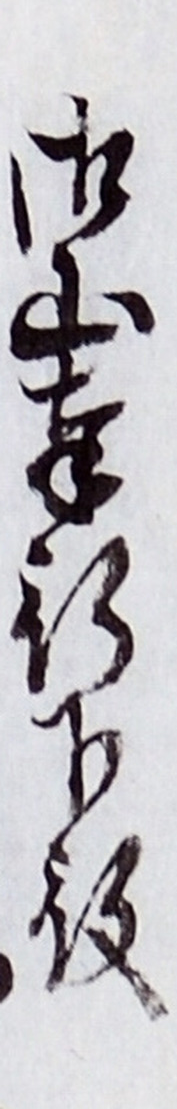覚御山奉行下役
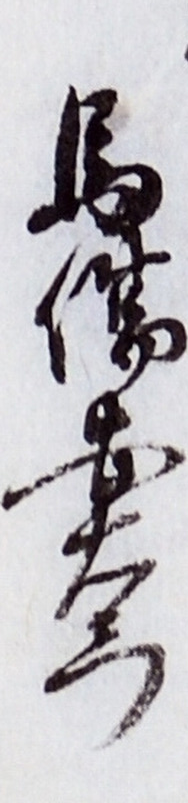馬橋安右衛門
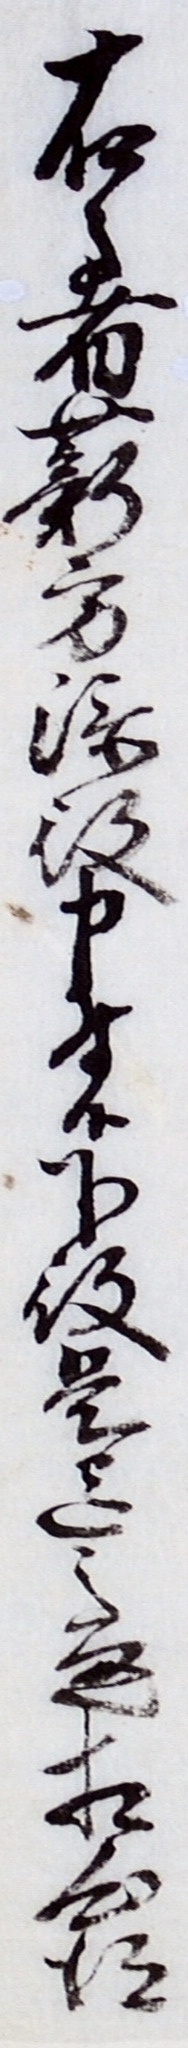右之者薪方添役申付候下役是迄之通相心得
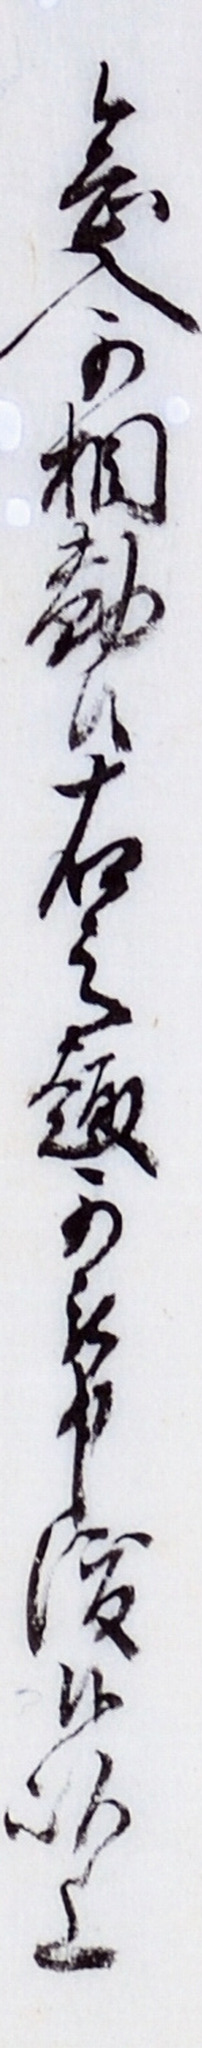念入可相勤候右之趣可被申渡候以上
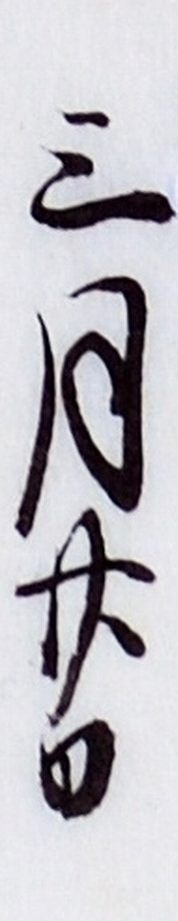三月廿日
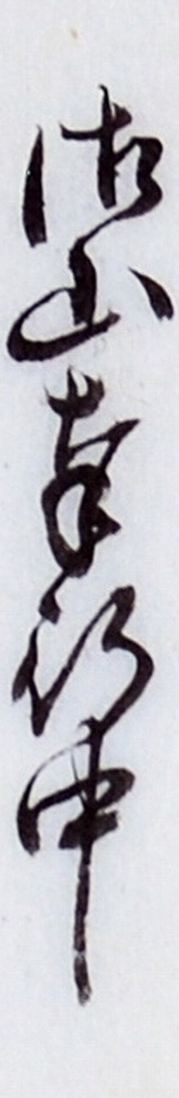御山奉行中
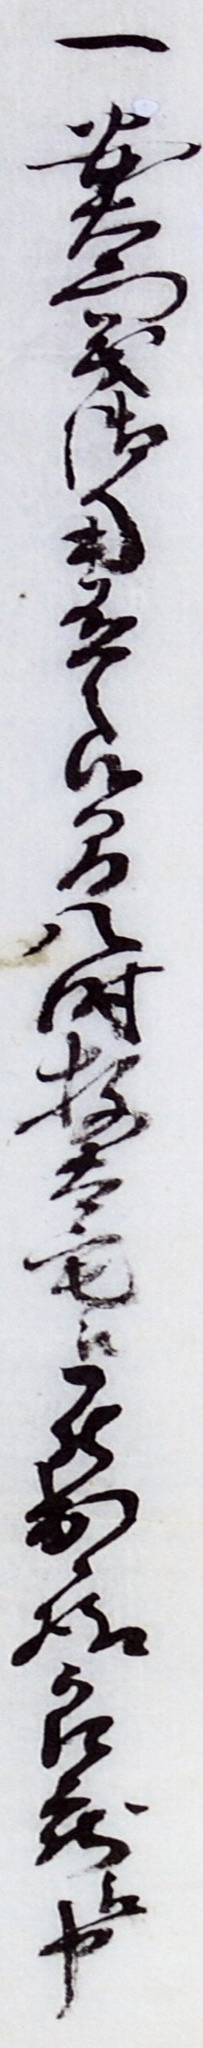一安右衛門義御用有之候間八時数太宅江罷出候様良蔵江申
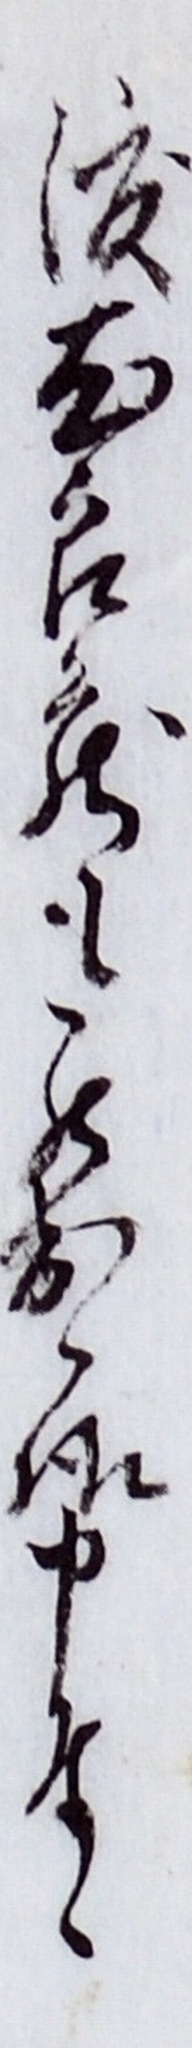渡尤良蔵も罷出候様申付候
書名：御山奉行御用控
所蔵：伊那市立高遠町図書館・合同会社AMANE
